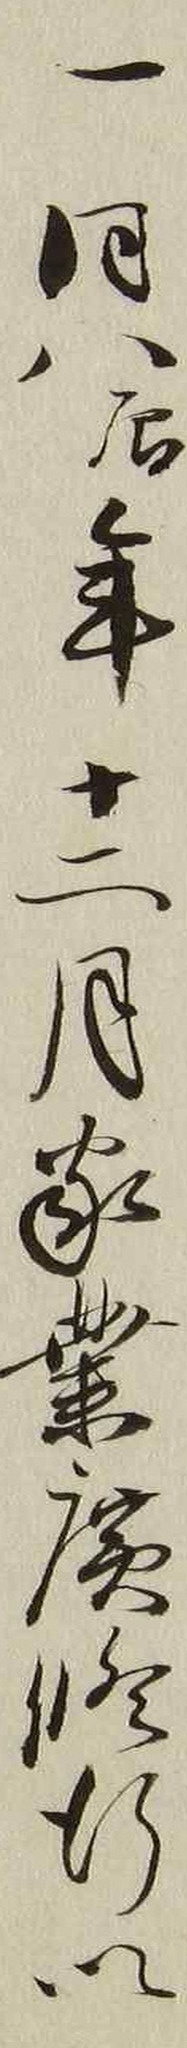一同八辰年十二月家業広修行い
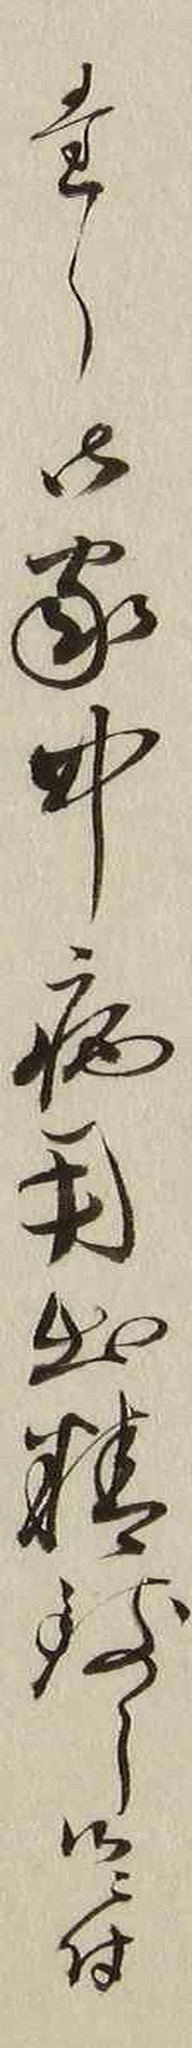たし御家中病用出精致し候に付
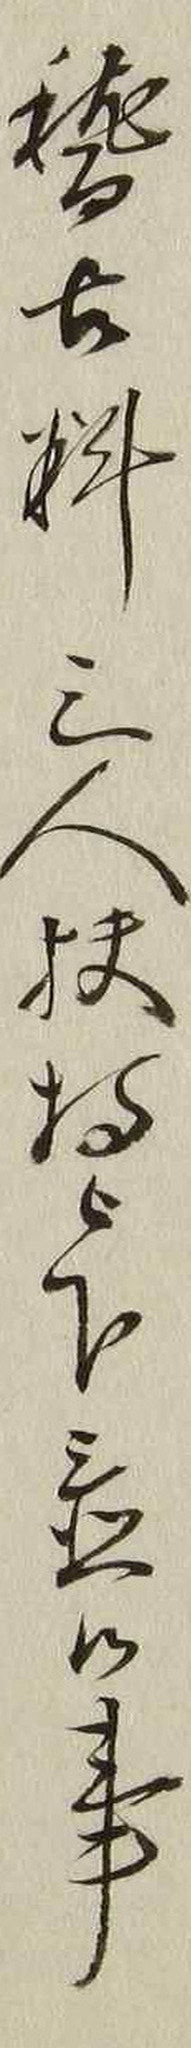稽古料三人扶持被下置候事
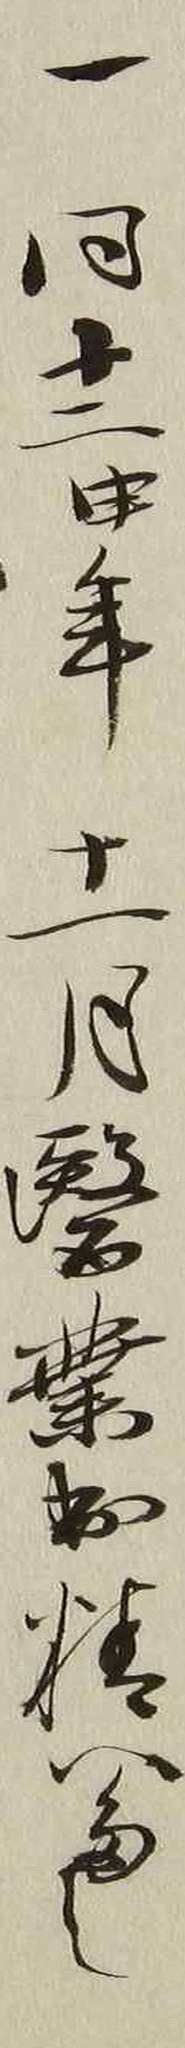一同十二申年十一月医業出精いたし
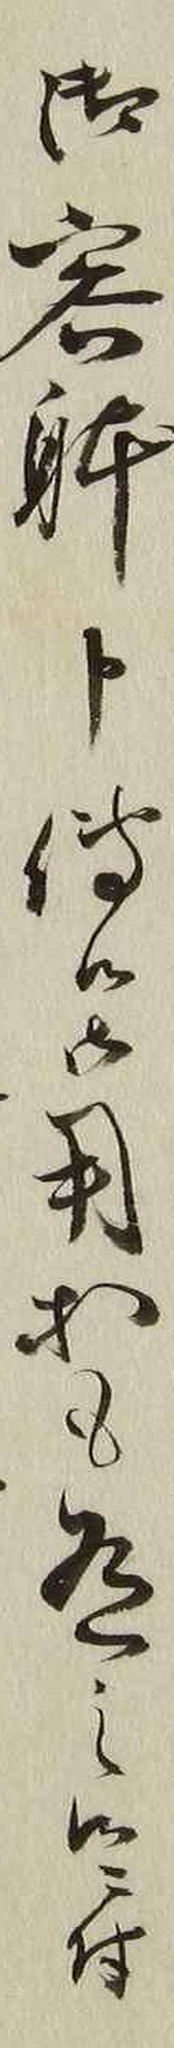御容体申伝候御用等も有之候に付
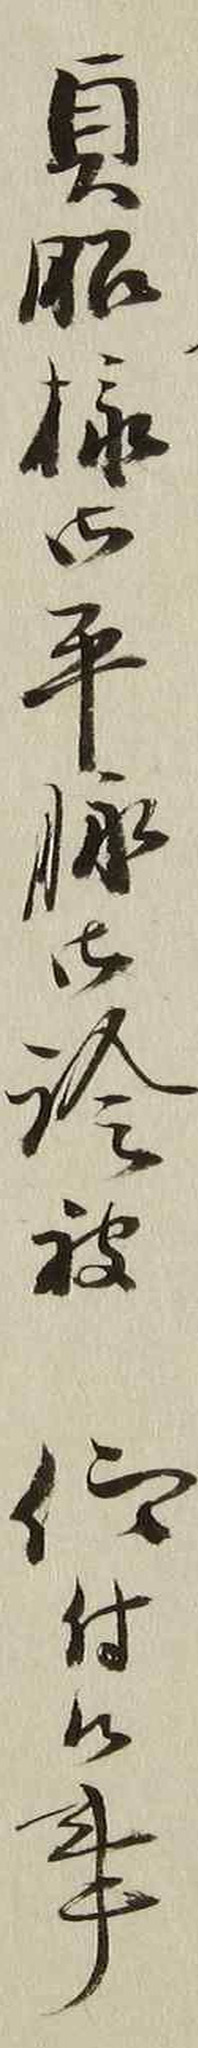貞昭様御平脈御診被仰付候事
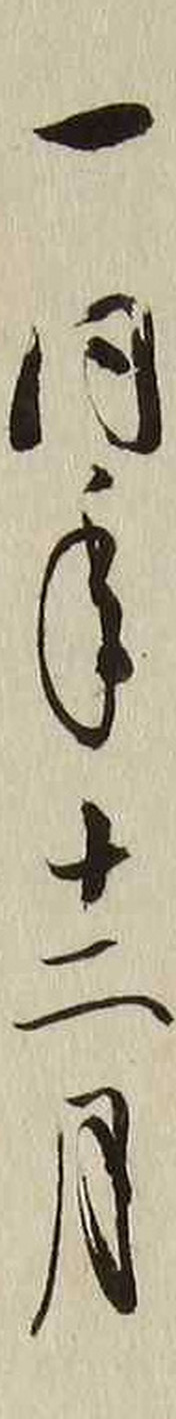一同年十二月
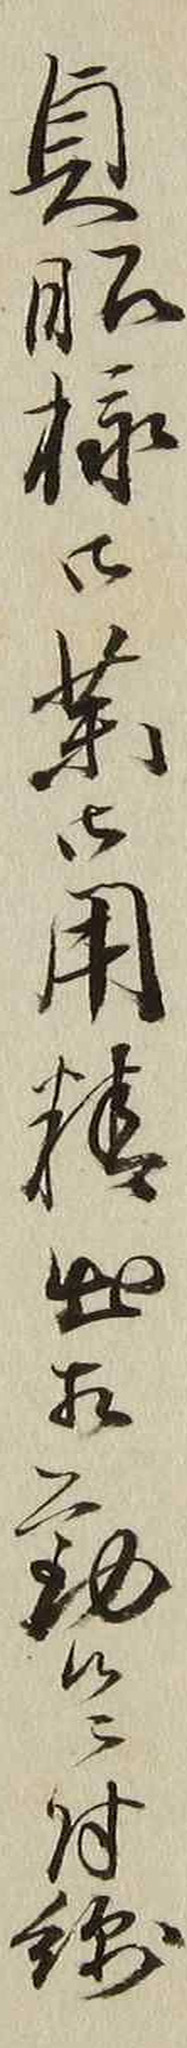貞昭様御薬御用精出相勤候に付綿
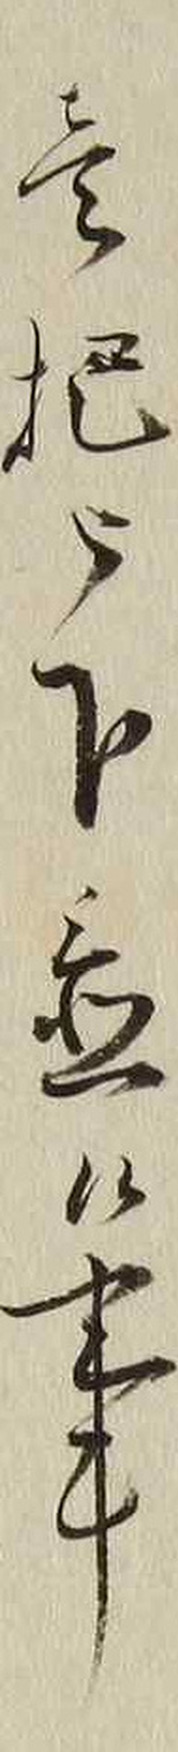壱把被下置候事
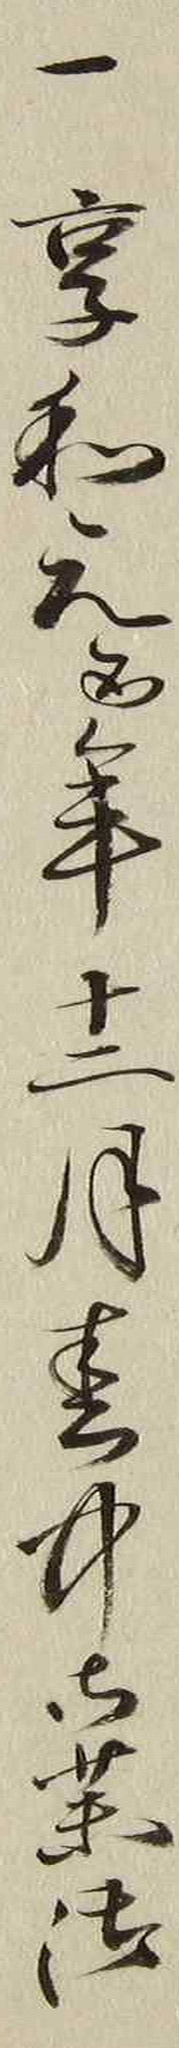一享和元酉年十二月春中御薬御
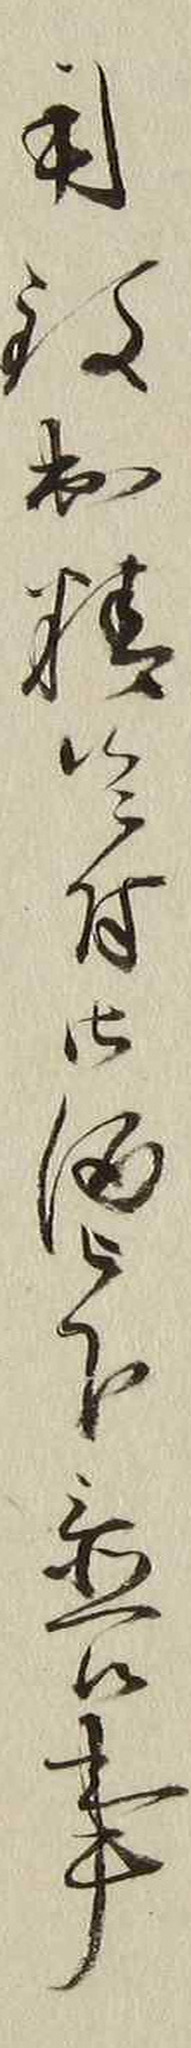用致出精候に付御酒被下置候事
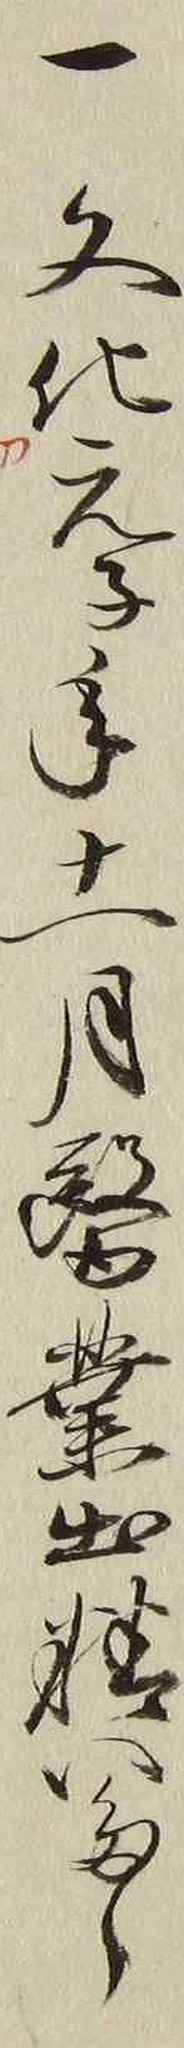一文化元子年十一月医業出精いたし
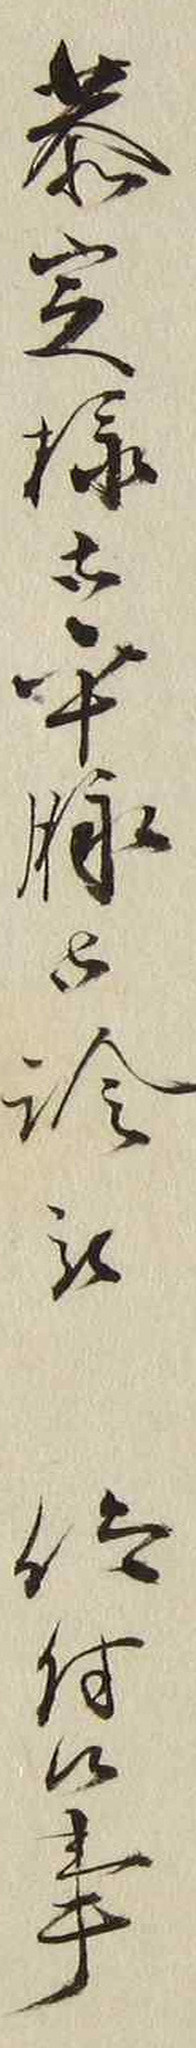恭定様御平脈御診被仰付候事
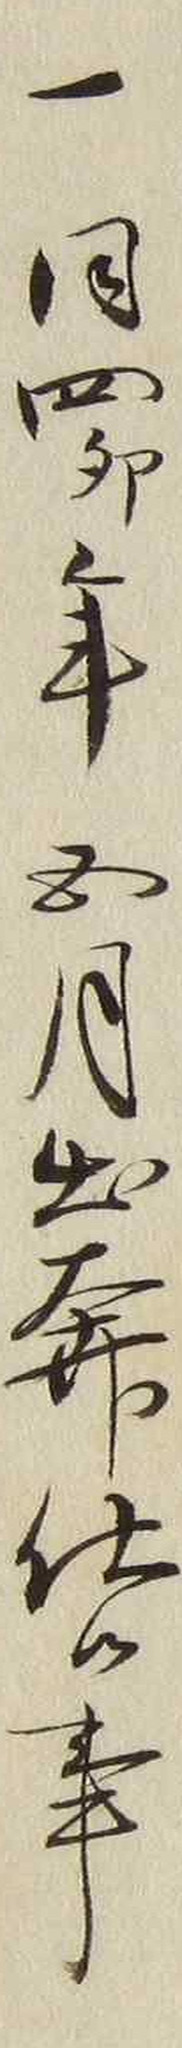一同四卯年五月出奔仕候事
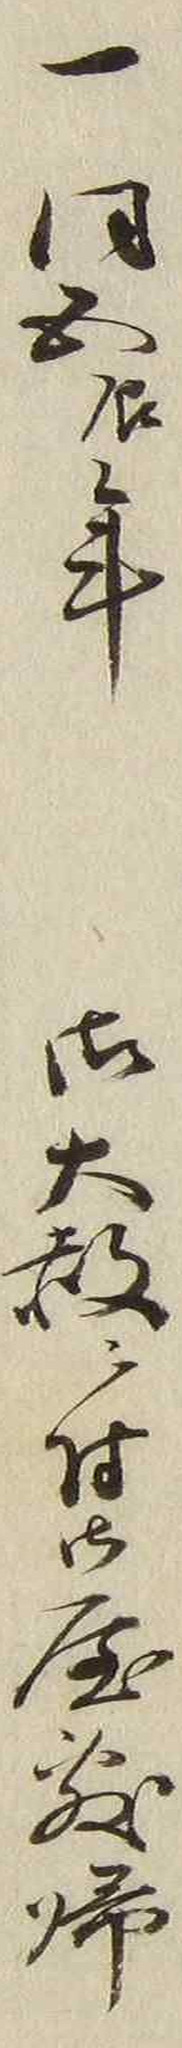一同五辰年御大赦に付御屋敷帰

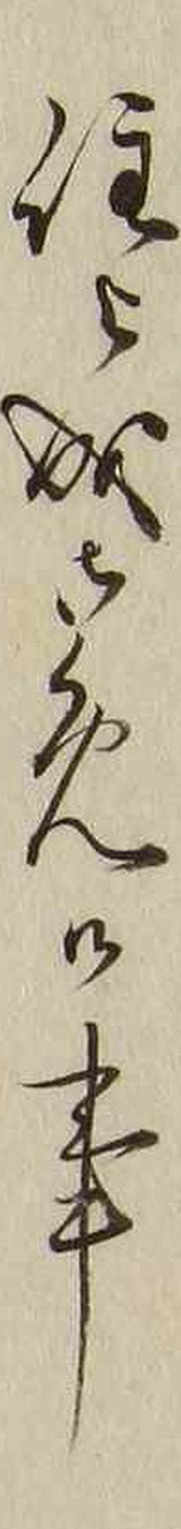住被成御免候事
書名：諸士系譜　巻之157　ね之部1
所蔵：会津若松市立会津図書館
